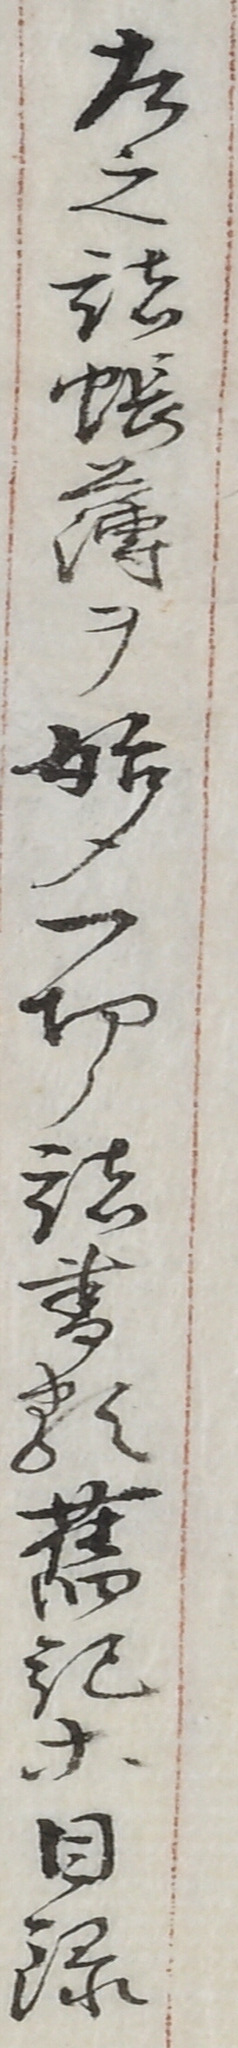左之諸帳簿ヲ始メ一切諸書類旧記等目録
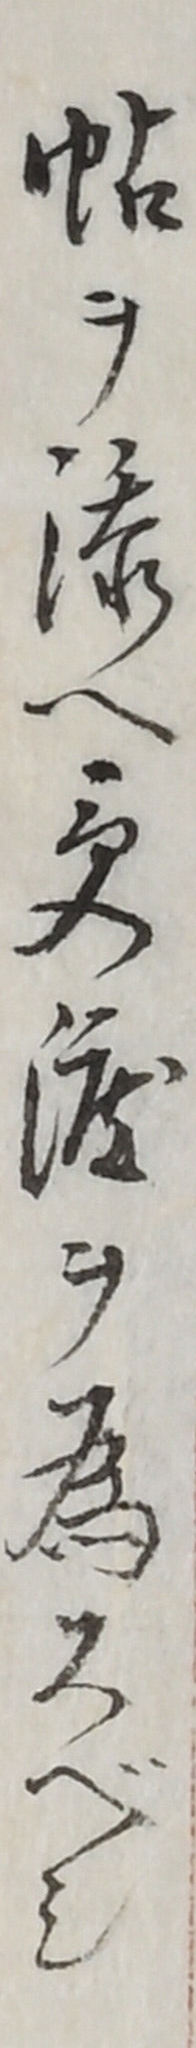帖ヲ添へ受渡ヲ為スべシ

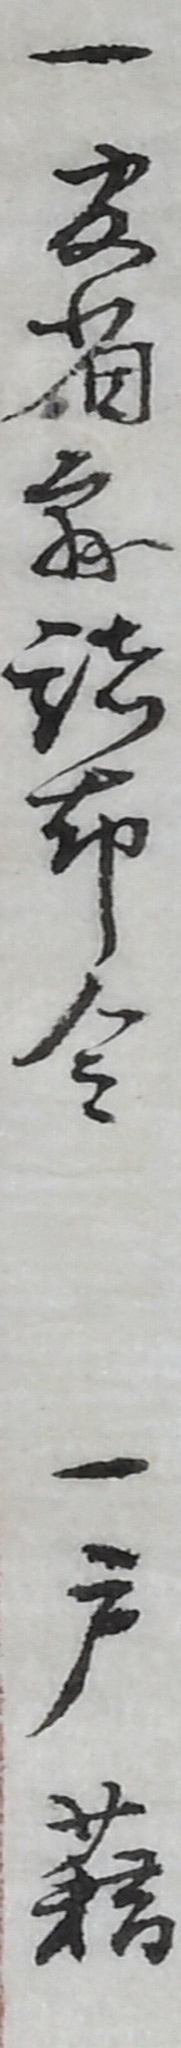一官省県諸布令一戸籍
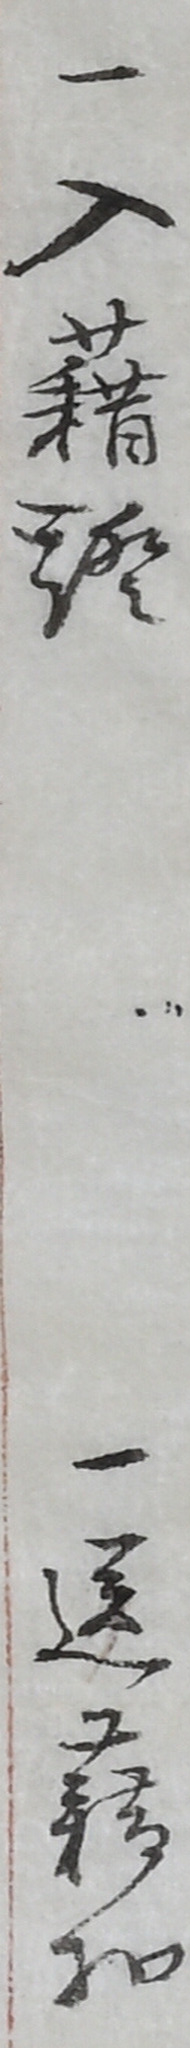一入籍證一送籍扣
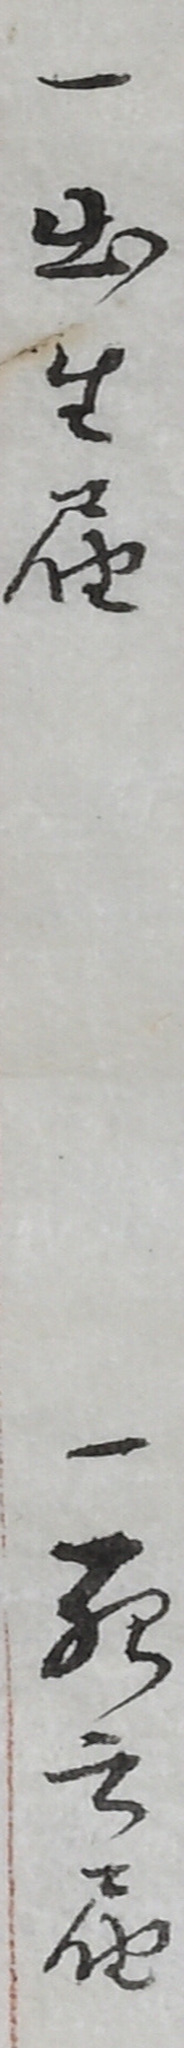一出生届一死亡届
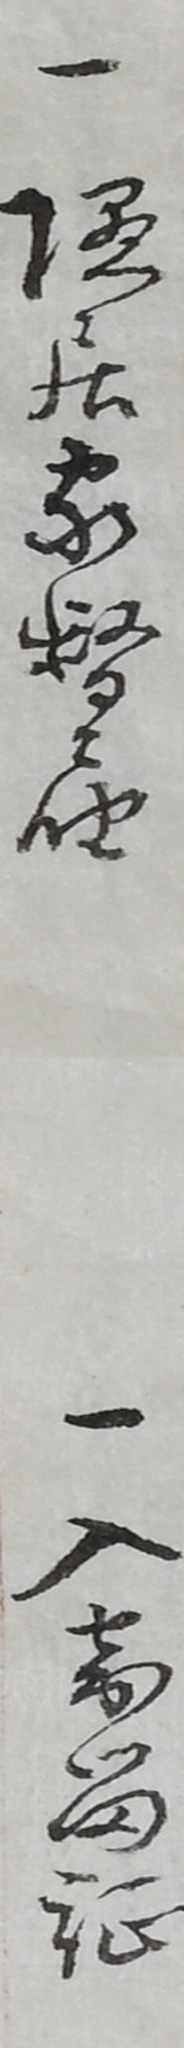一隠居家督届一入寄留証
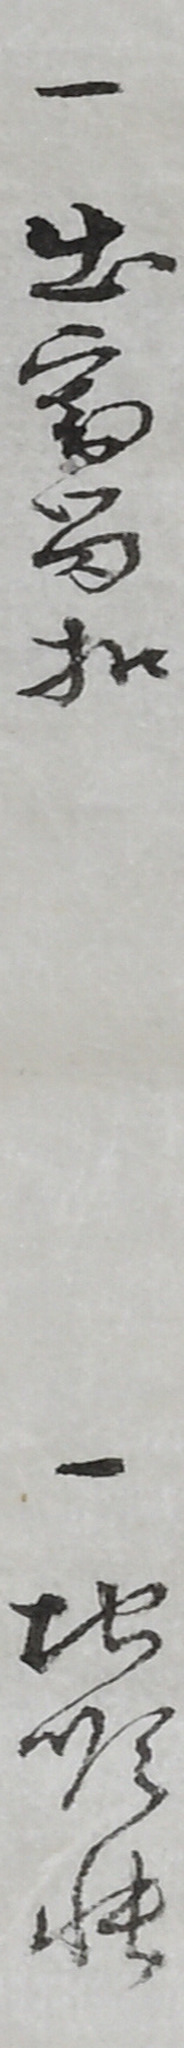一出寄留扣一地順帳
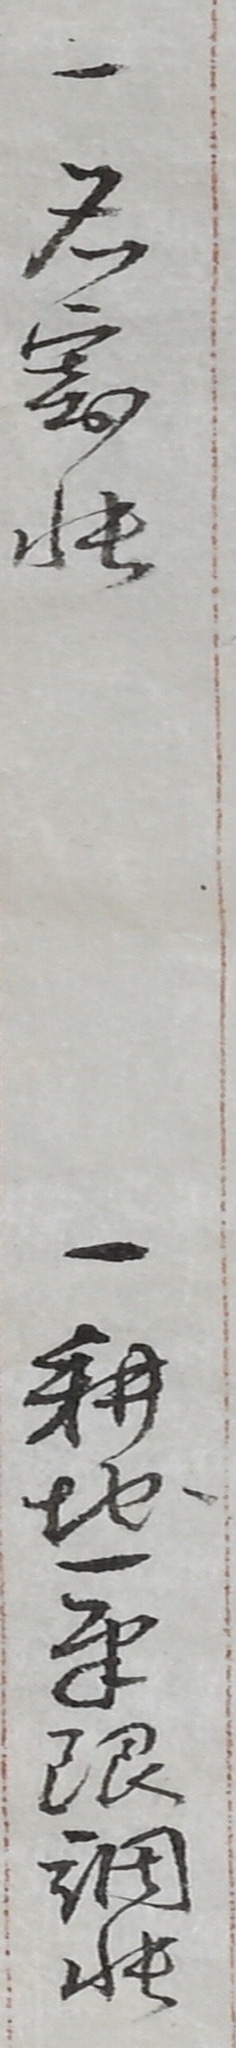一名寄帳一耕地一筆限調帳
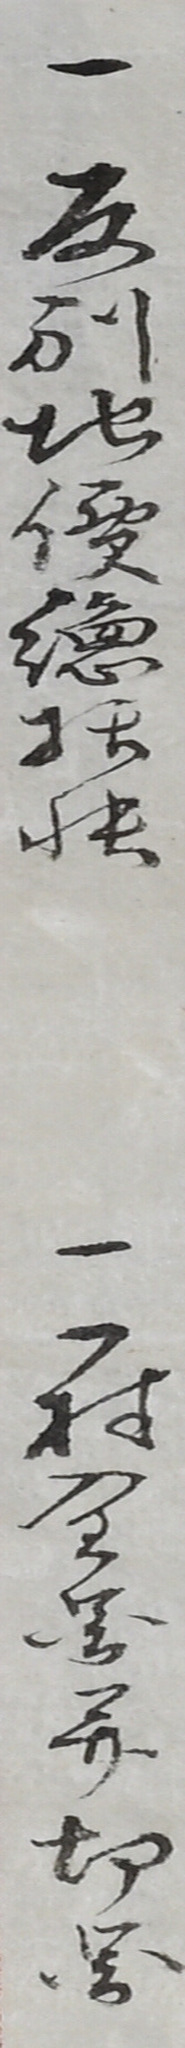一反別地価総括帳一一村全図并切図
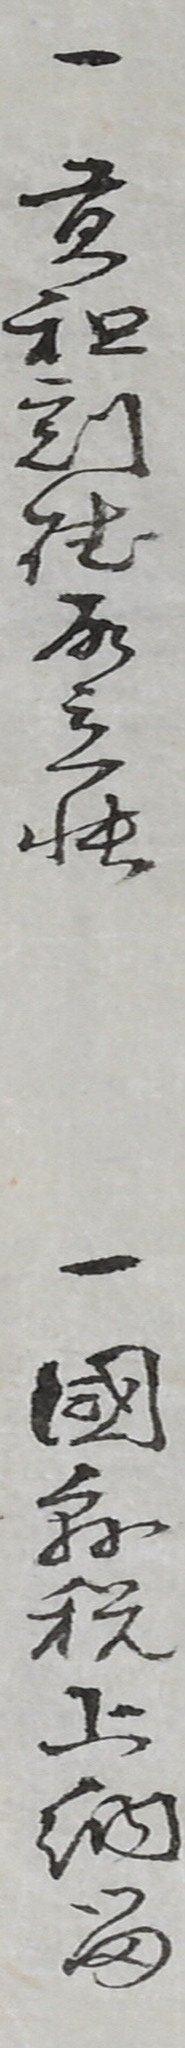一貢祖割賦取立帳一国県税上納留
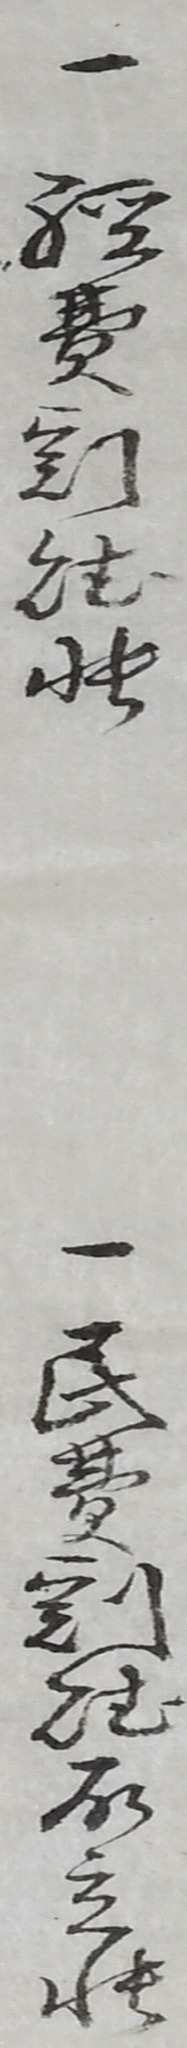一経費割賦帳一民費割賦取立帳
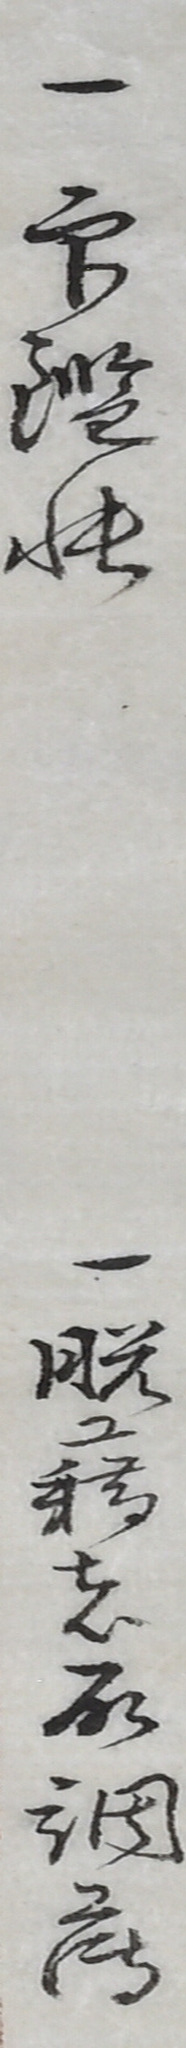一印鑑帳一脱藉者取調薄
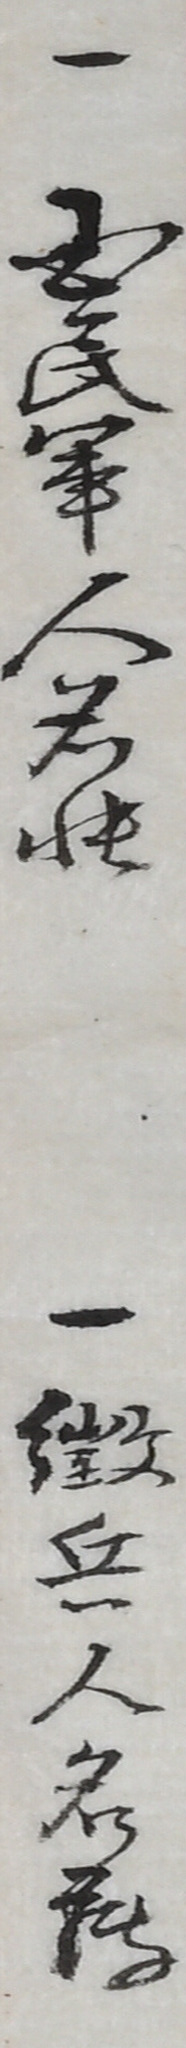一国民軍人名帳一徴兵人名薄
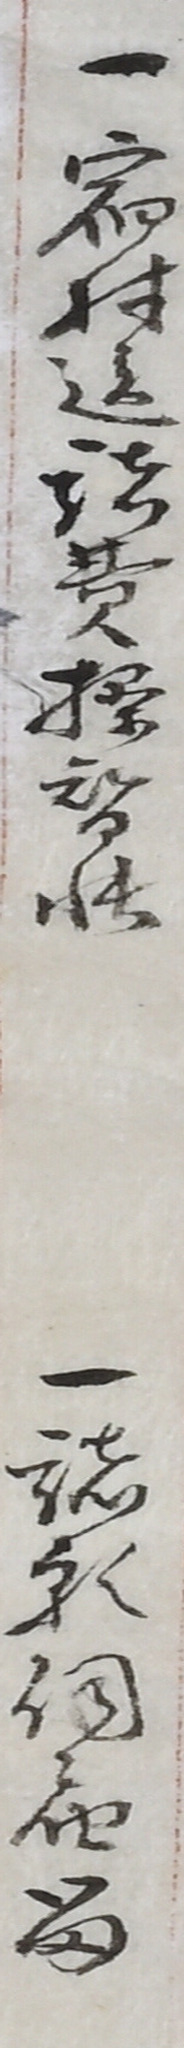一宿村送諸費操替帳一諸願伺届留
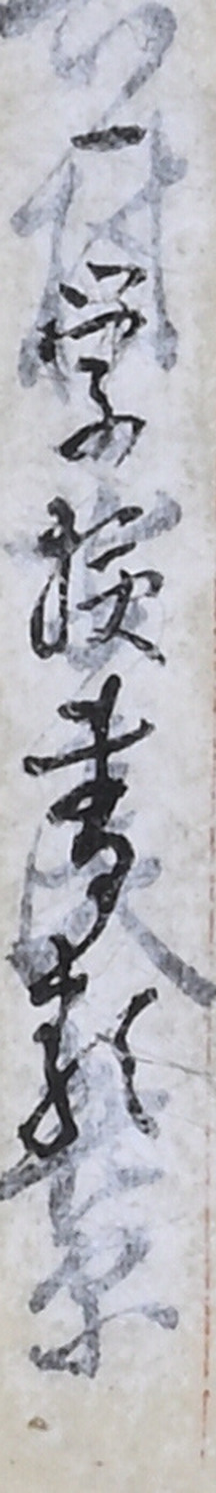一学校書類
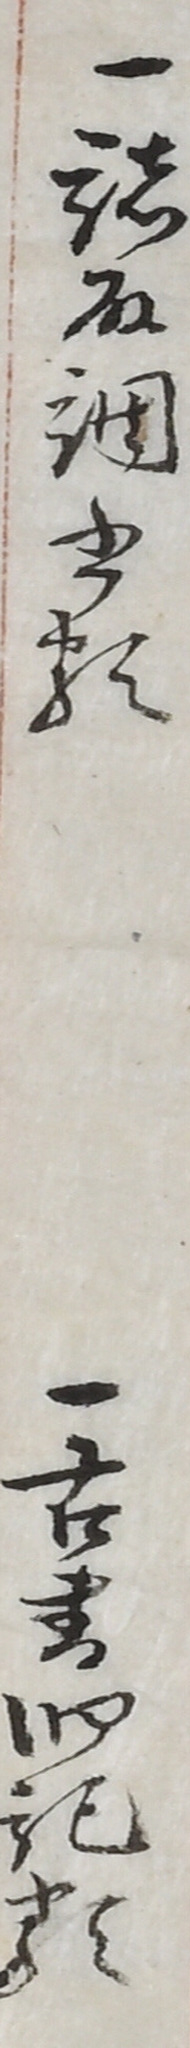一諸取調書類一古書旧記類
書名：郡役所勤務中御用抜書
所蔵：伊那市立高遠町図書館・合同会社AMANE
